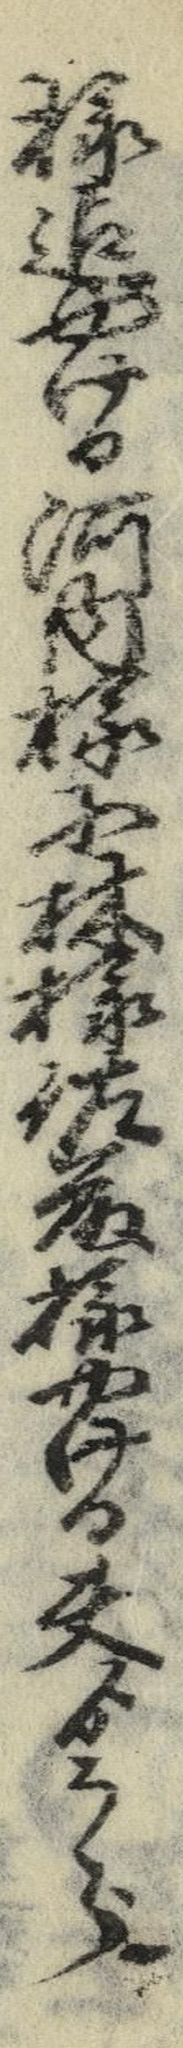様迄やける河内様小林様佐藤様やける夫ゟうら
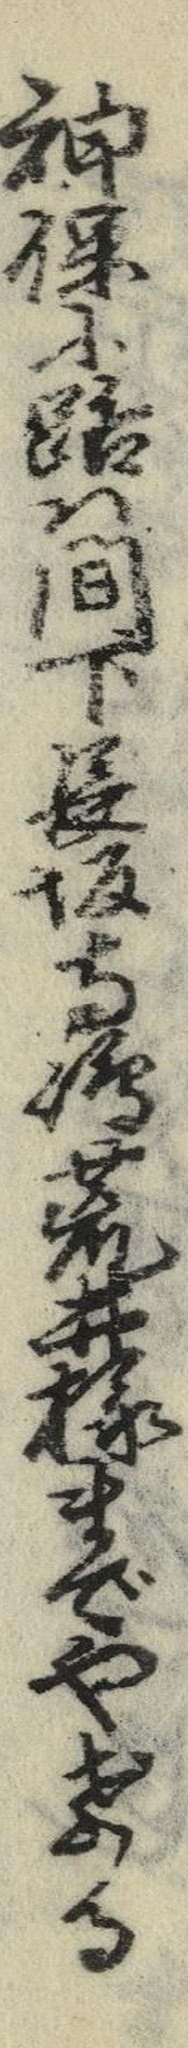神保小路は間下長坂寺嶋荒井様までやける
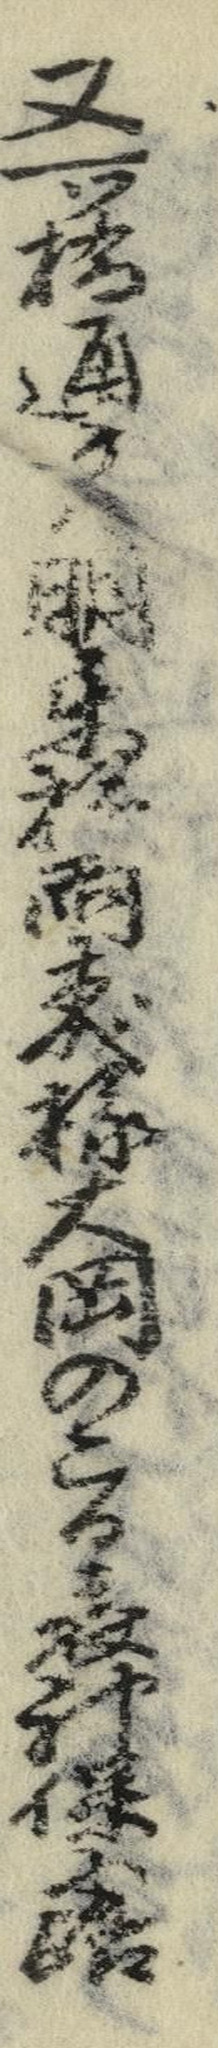又一ツ橋通りは明楽様雨森様大岡のこる表神保小路
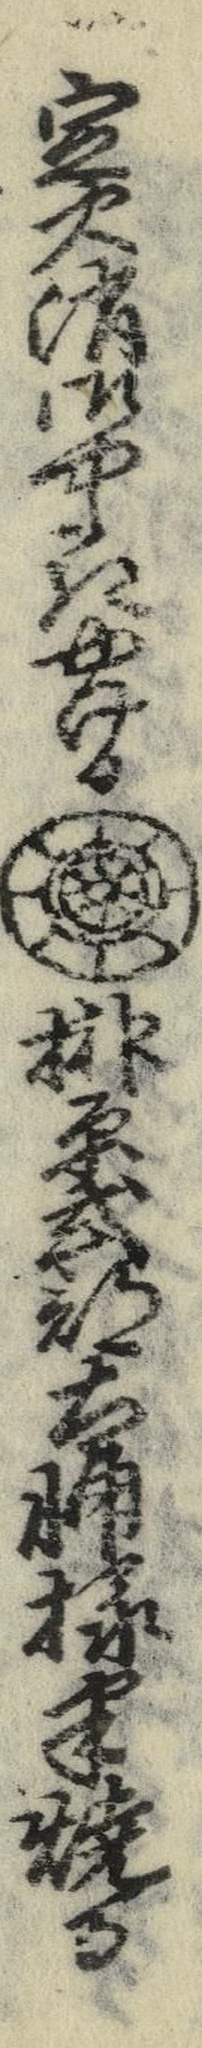定火消御やしきやける榊原式部大輔様半焼る
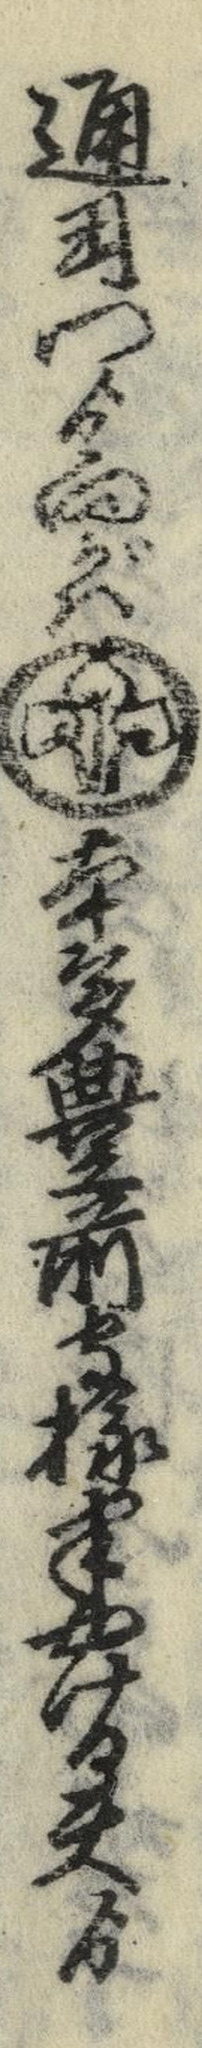通用門ゟ向がは本多豊前守様半やける夫ゟ
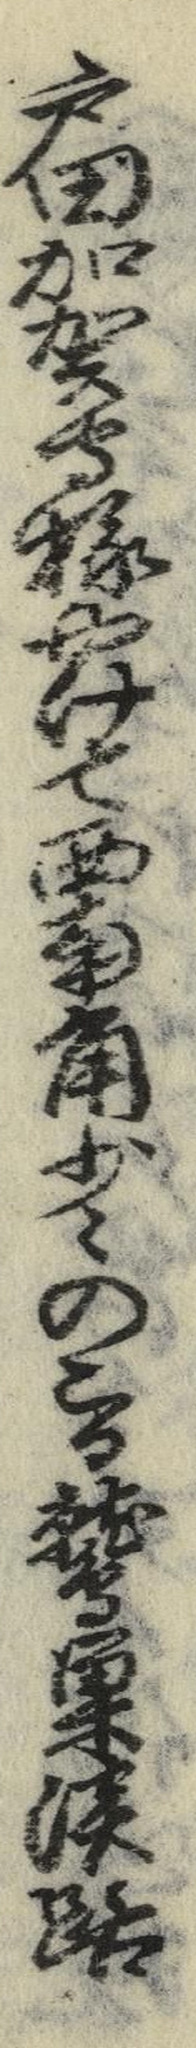戸田加賀守様やけて西南角少々のこる鷲巣淡路
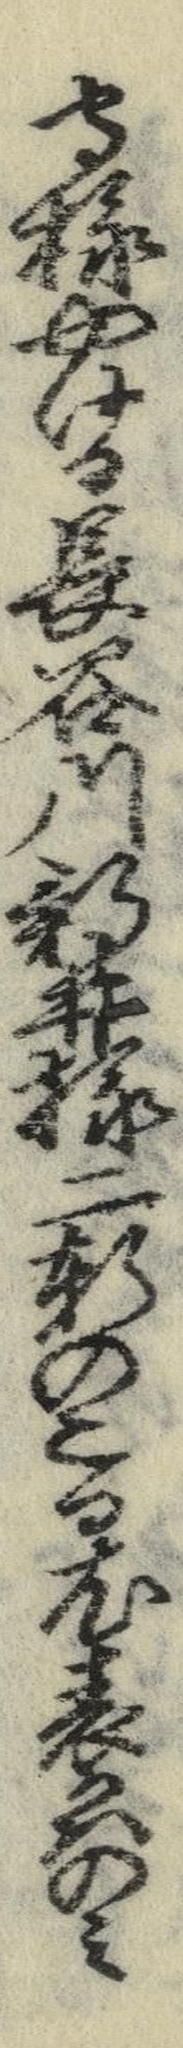守様やける長谷川新井様二軒のこる尤表かはのみ
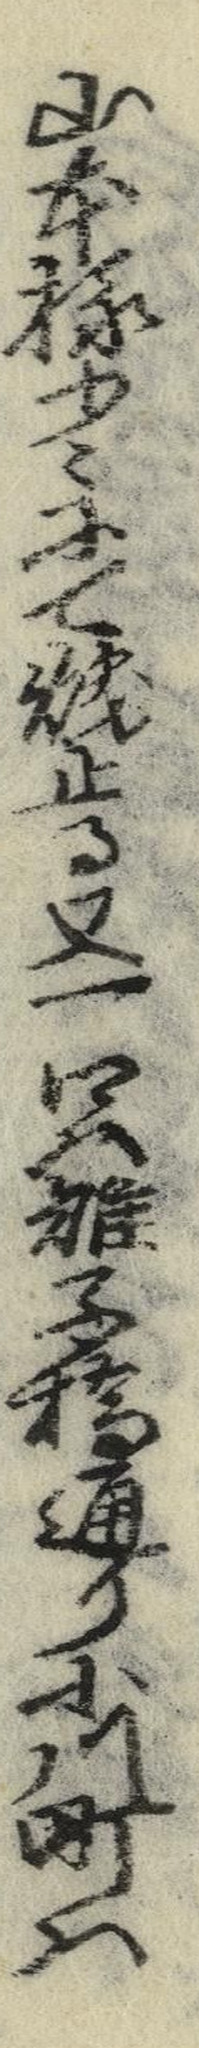山本様少々にて焼止る又一口は雑子橋通り小川町は
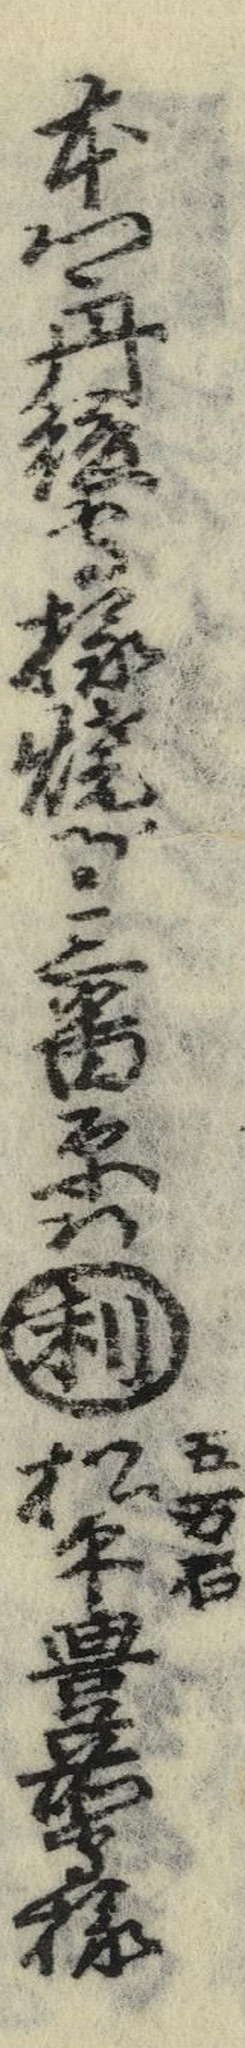本郷丹後守様焼る三番原は松平豊前守様
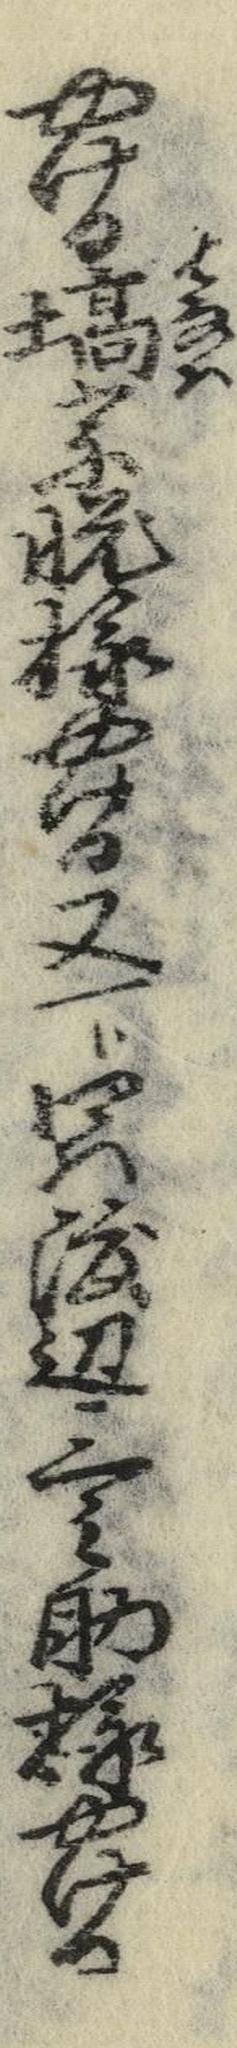やける塙宗悦様やける又一ト口は渡辺三之助様やける
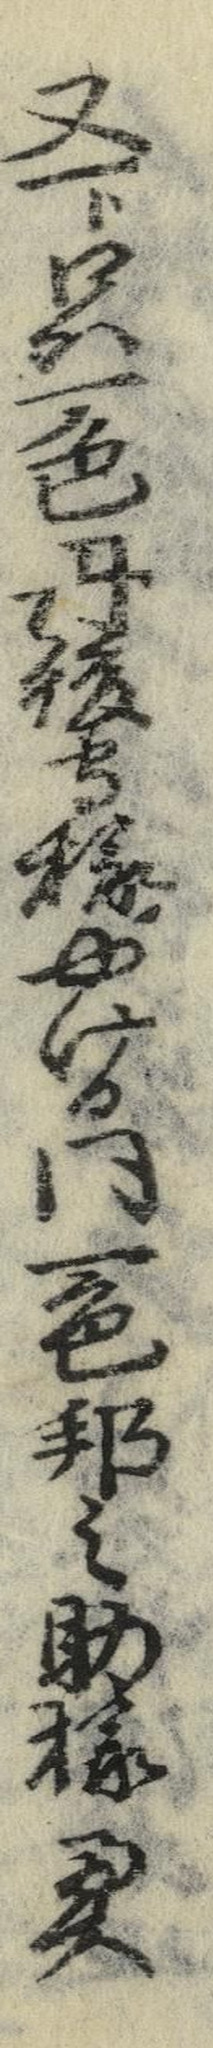又一ト口は一色丹後守様やける同一色邦之助様奥
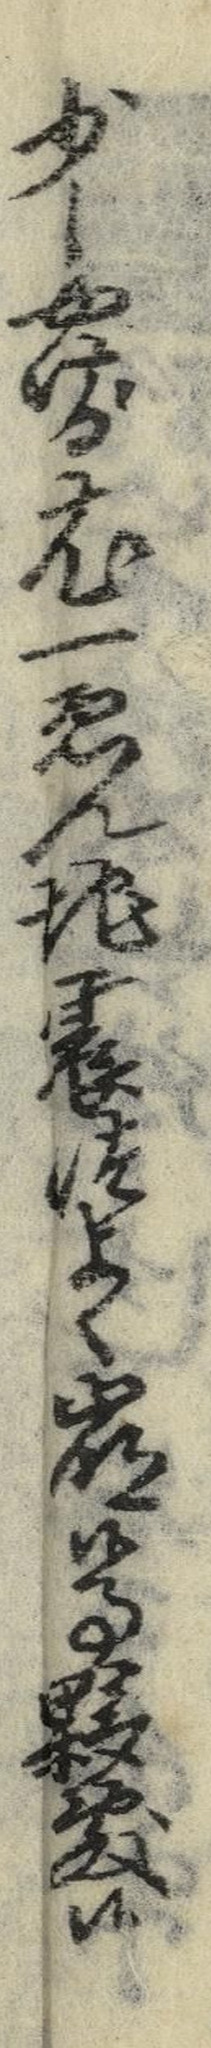少しやける尤一ゑん地震つよく崩れ夥敷候
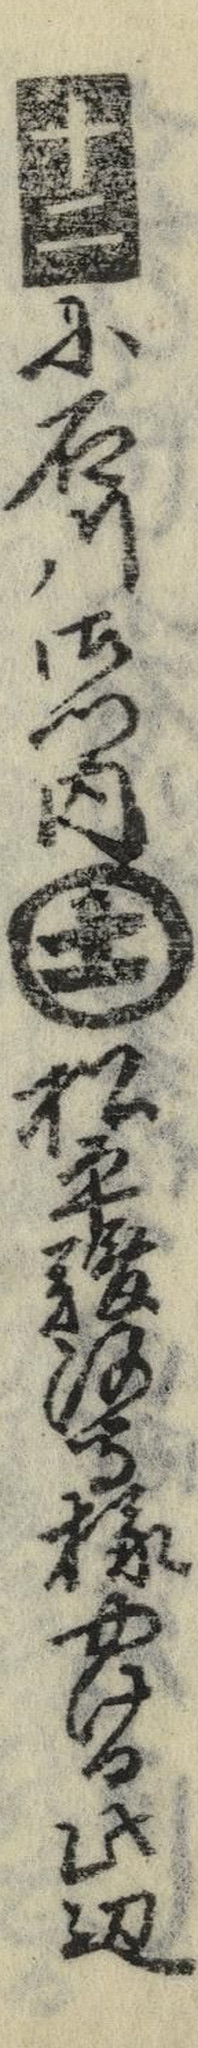十二小石川御門内松平駿河守様やける此辺
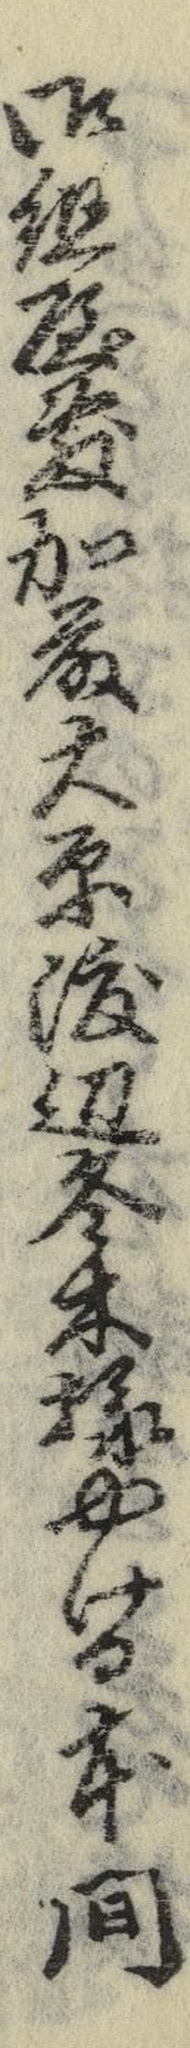御組屋敷加藤大原渡辺冬木様やける本間
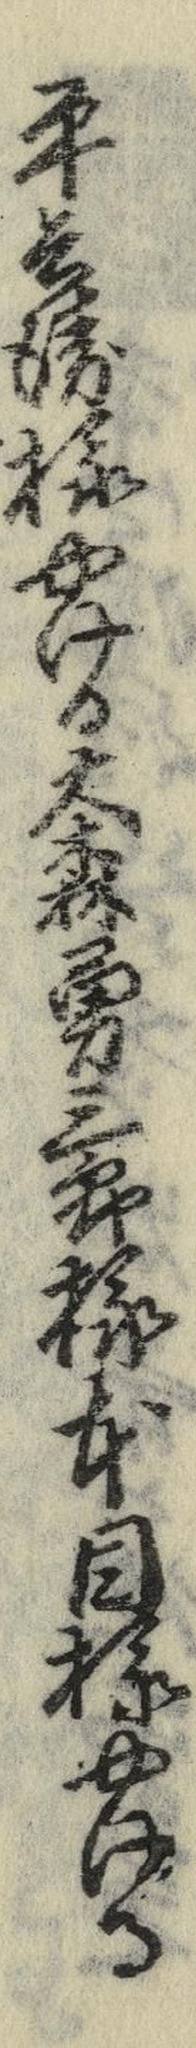平兵衛様やける大森勇三郎様本目様やける
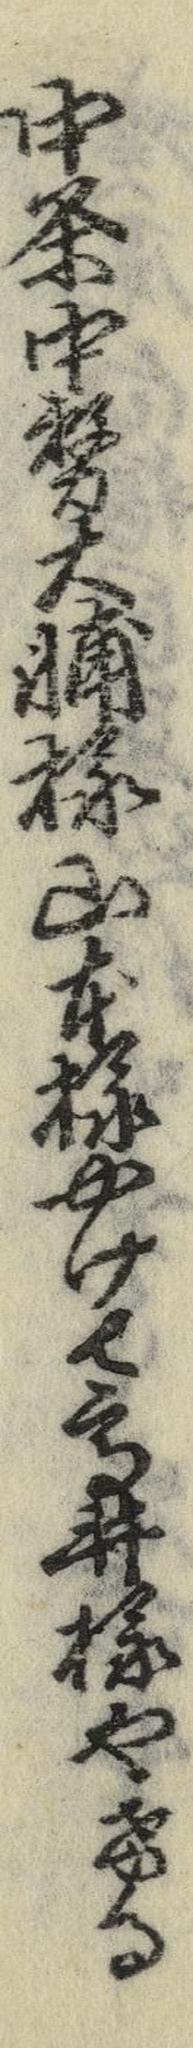中条中勢大輔様山本様やけて高井様やける
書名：地震類焼場所明細書之写　安政二卯年十月二日夜四ツ時過　御府内御屋敷方市中共、并街道筋近郷聞書
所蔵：東京大学地震研究所図書室 Earthquake Research Institute Library, The University of Tokyo, JAPAN
